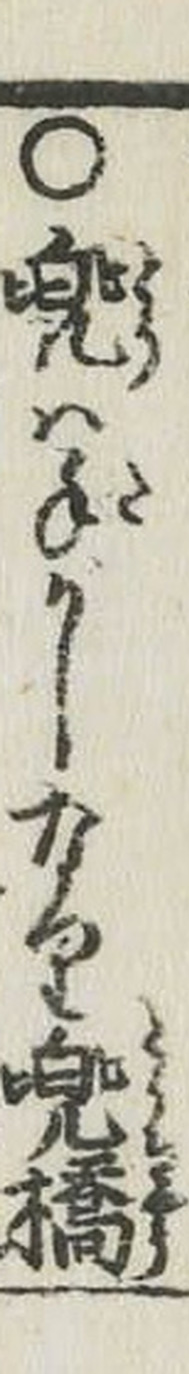○兜は手かしなり兜橋
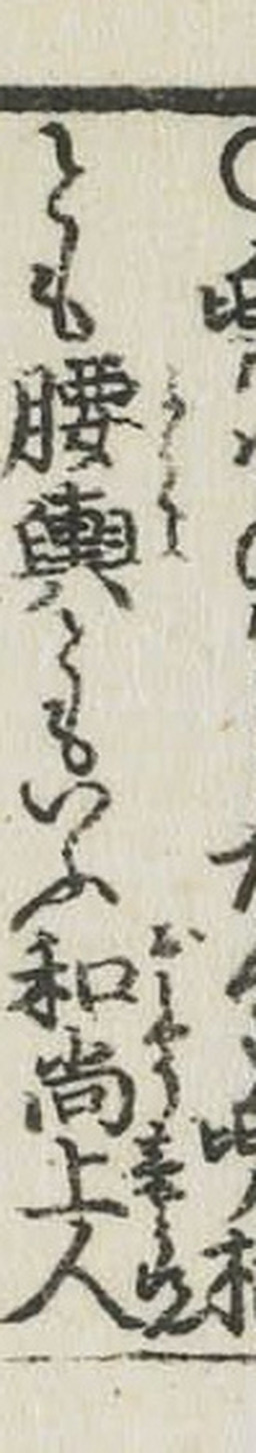とも腰輿ともいふ和尚上人
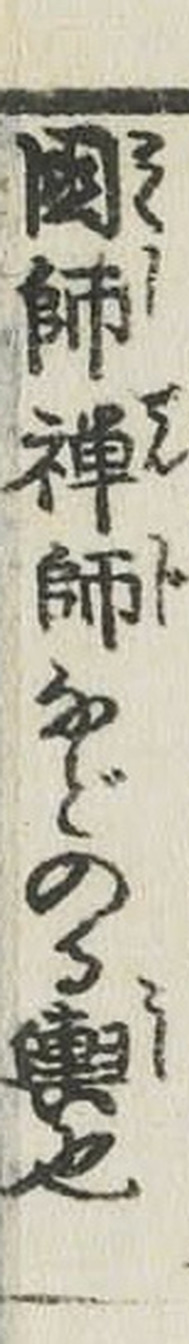国師禅師などのる輿也
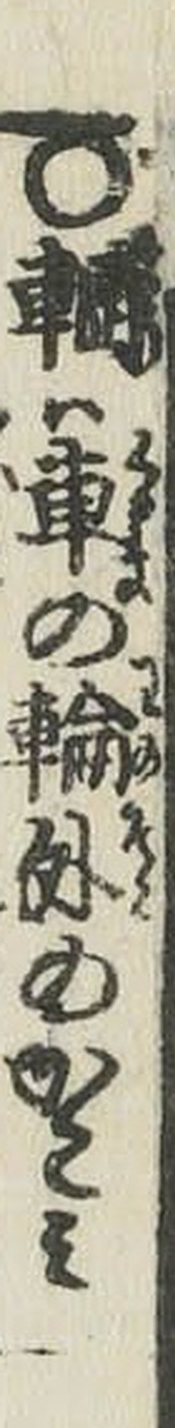○輞は車の輪外のかこみ
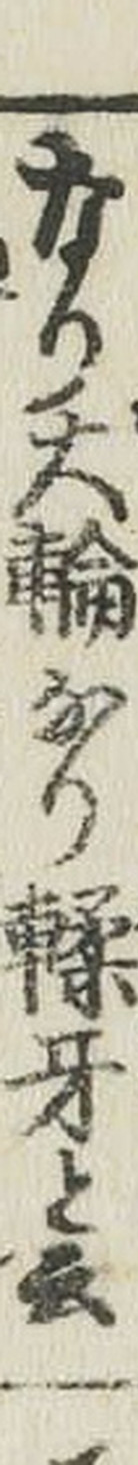なり大輪なり輮牙と云
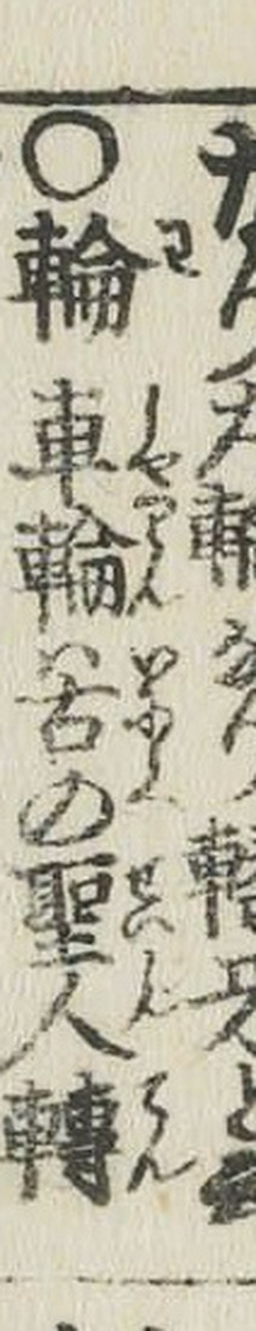○輪車輪は古の聖人転
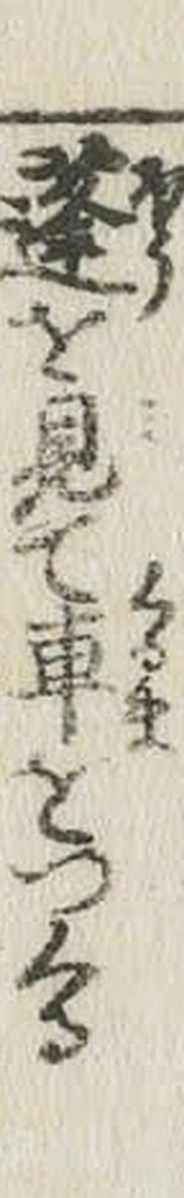蓬を見て車をつくる
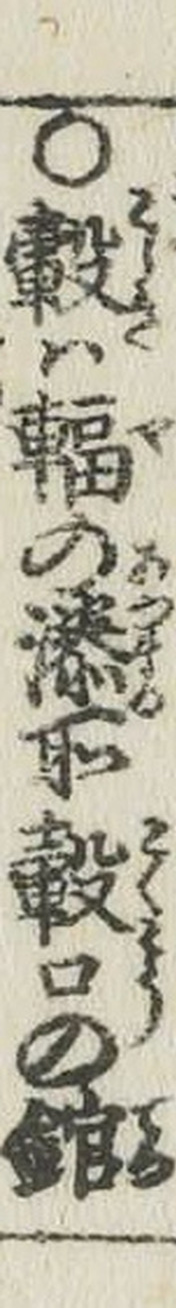○轂は輻の湊所轂口の錧
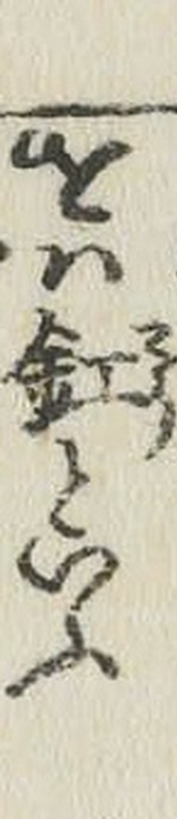をは釭といふ
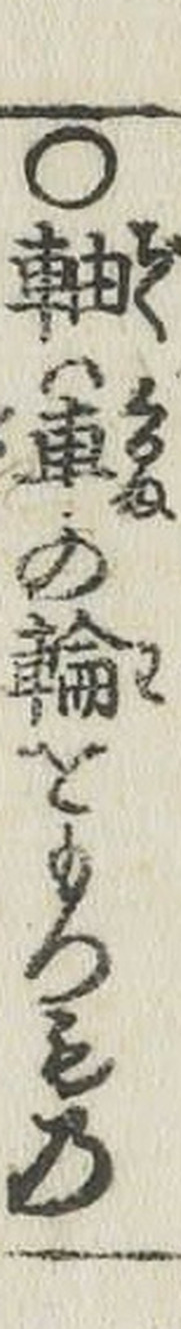○軸は車の輪をもつもの
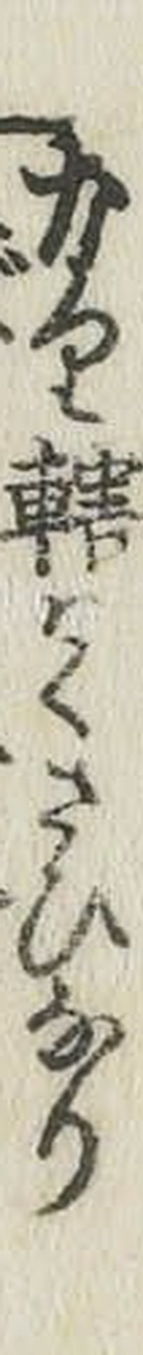なり轄はくさひなり
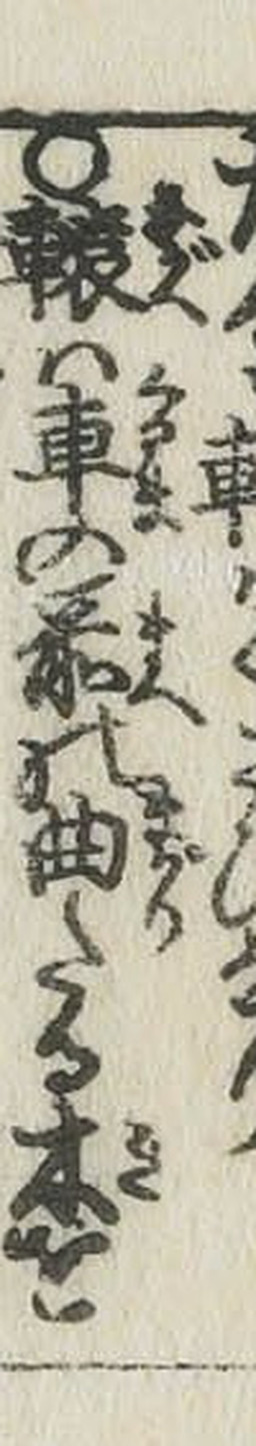○轅は車の前の曲たる木を
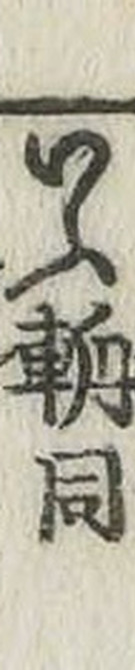いふ輈同
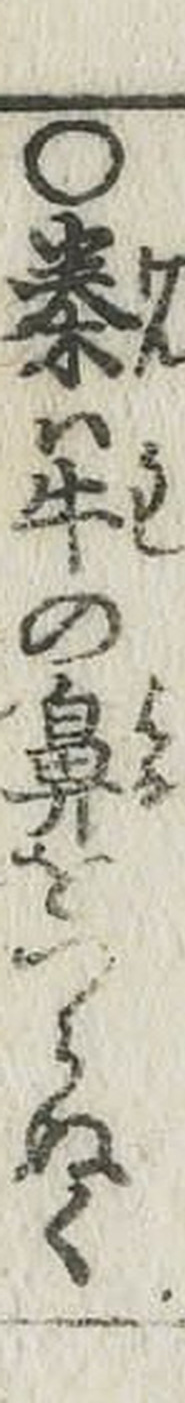○桊は牛の鼻をつらぬく
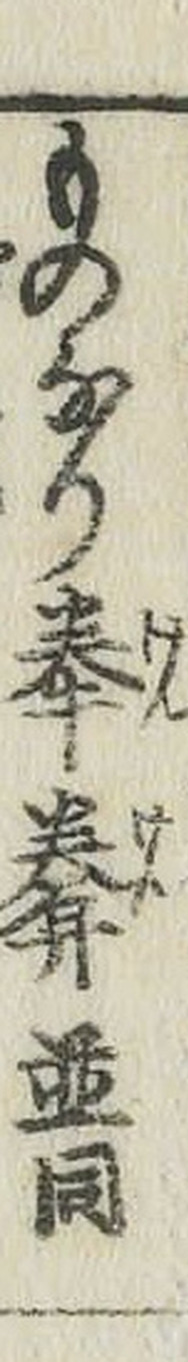ものなり牶▢並同
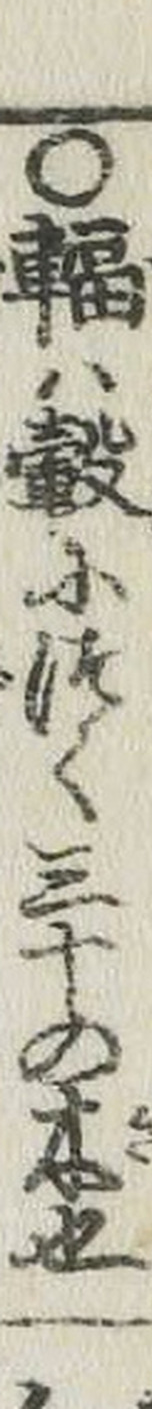○輻は轂につく三十の木也
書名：増補頭書訓蒙図彙大成 10巻 5:巻之9-11
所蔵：東京学芸大学教育コンテンツアーカイブ
